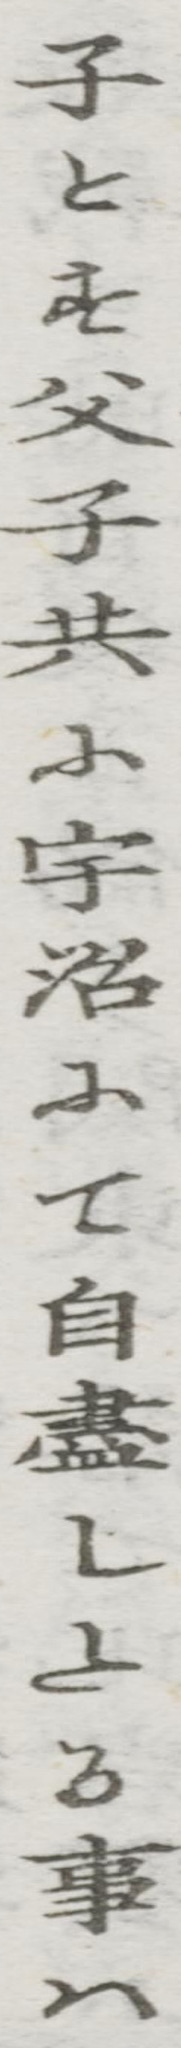子とす父子共に宇治にて自盡したる事は
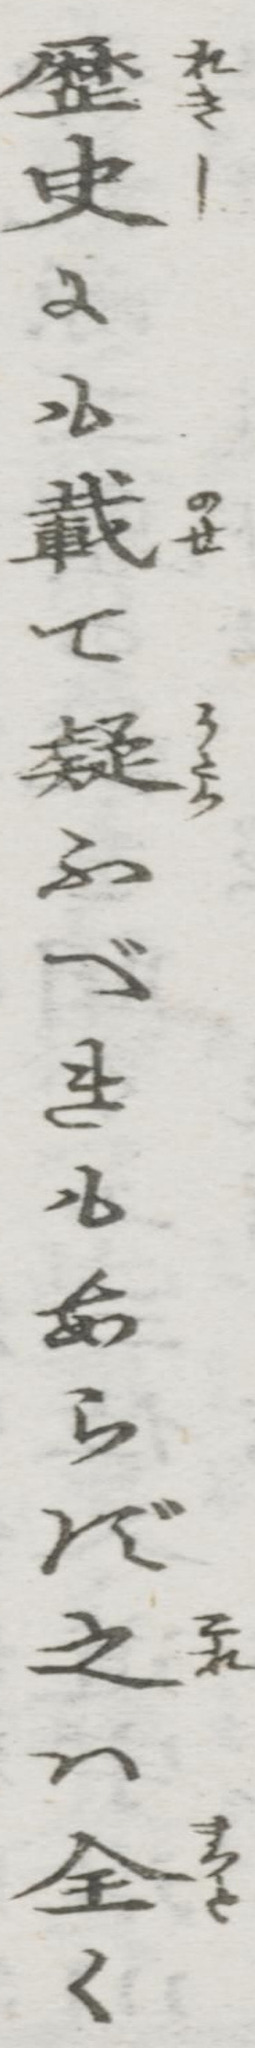歴史にも載て疑ふべきもあらず之は全く
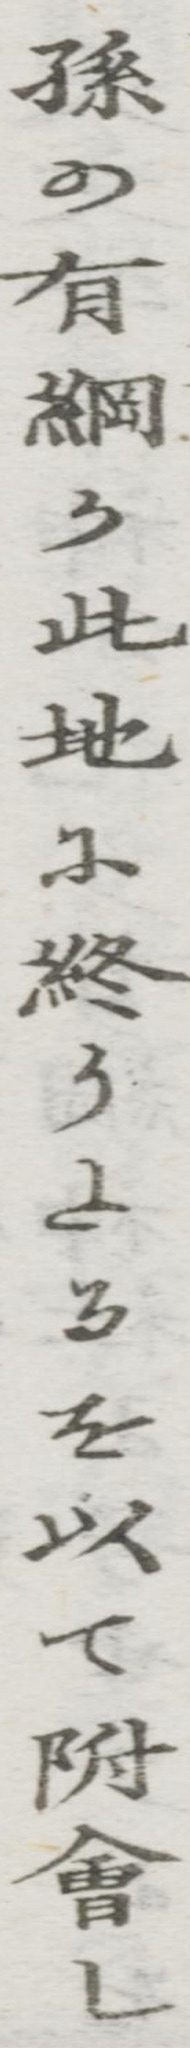孫の有綱か此地に終りたるを以て附會し
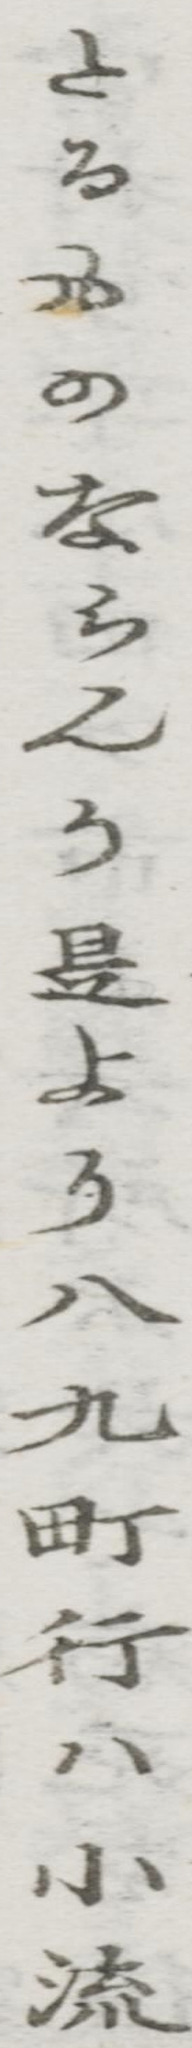たるものならんか是より八九町行は小流
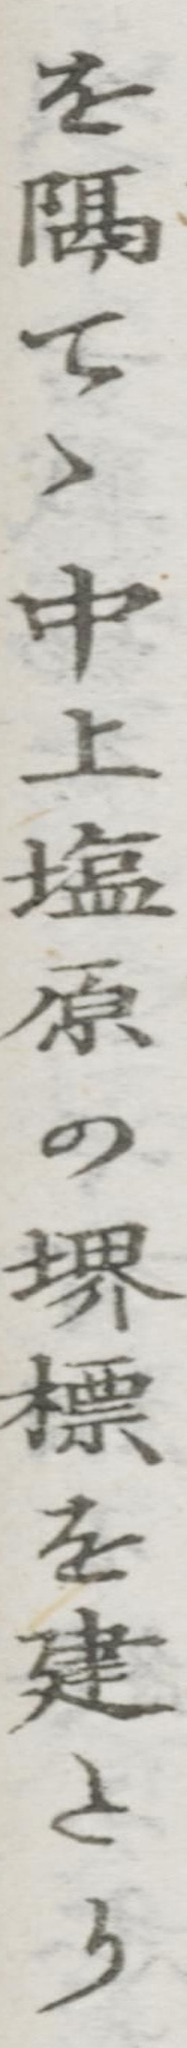を隔てゝ中上塩原の堺標を建たり
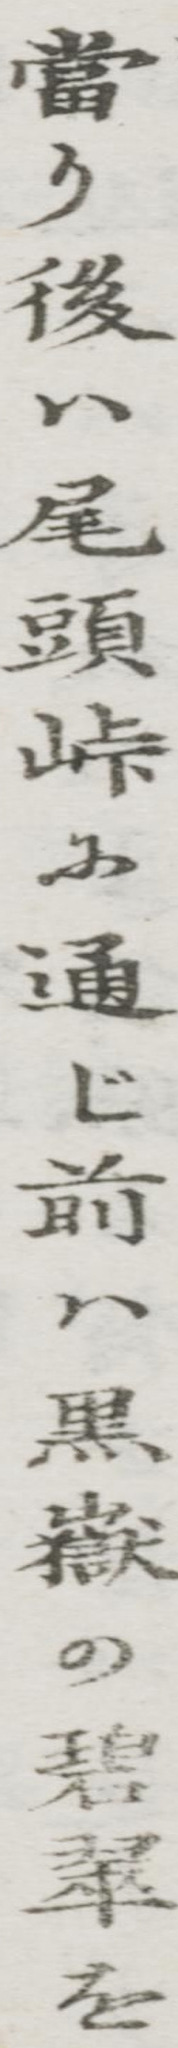當り後は尾頭峠に通じ前は黒嶽の碧翠を
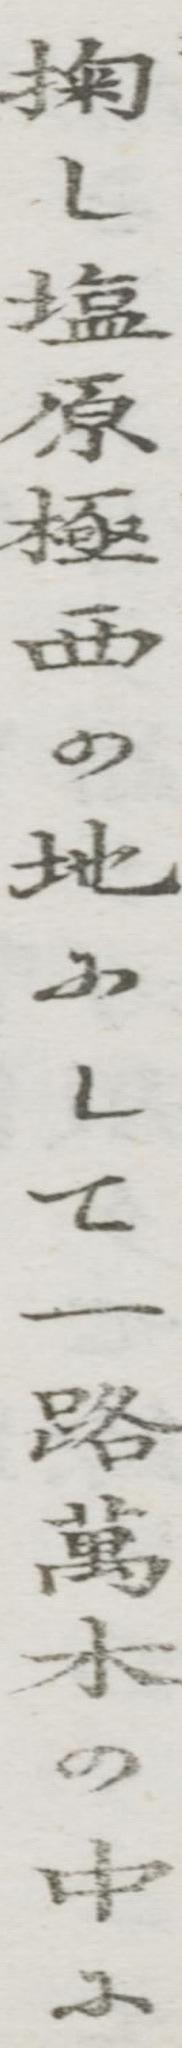掬し塩原極西の地にして一路萬木の中に
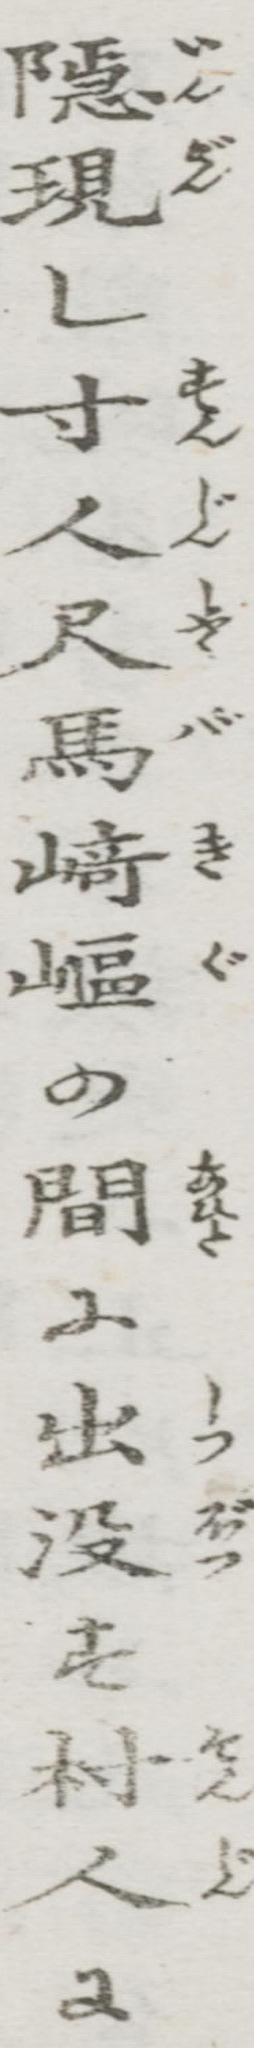隠現し寸人尺馬崎嶇の間に出没す村人に
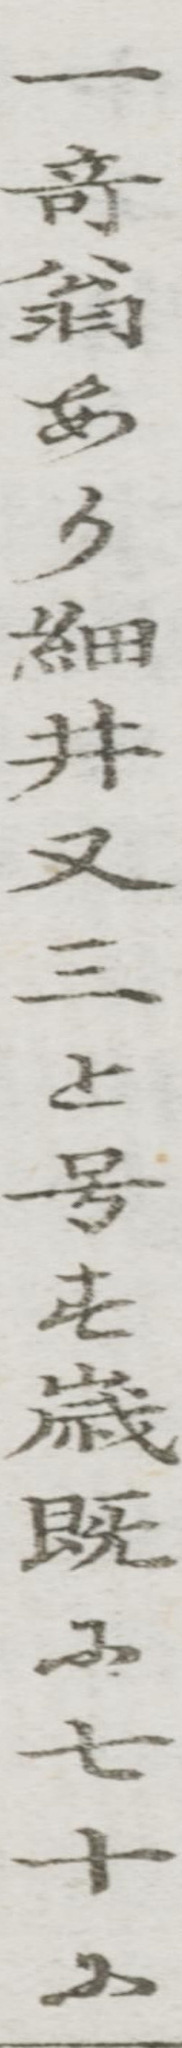一奇翁あり細井又三と号す歳既に七十に
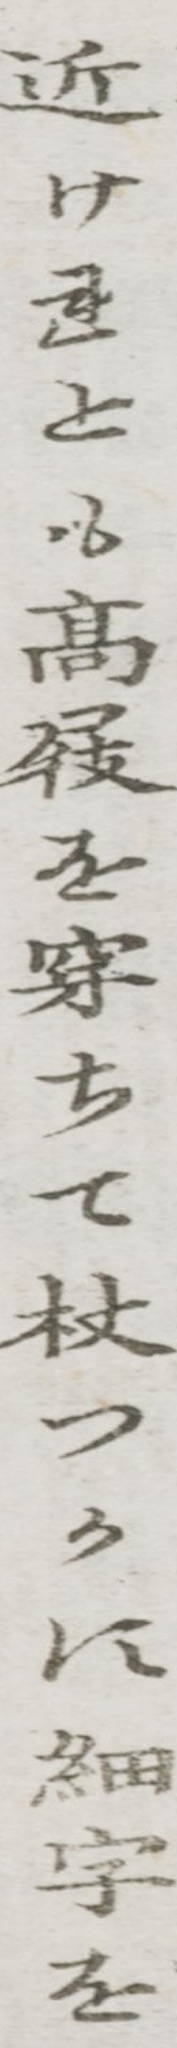近けれとも高屐を穿ちて杖つかす細字を
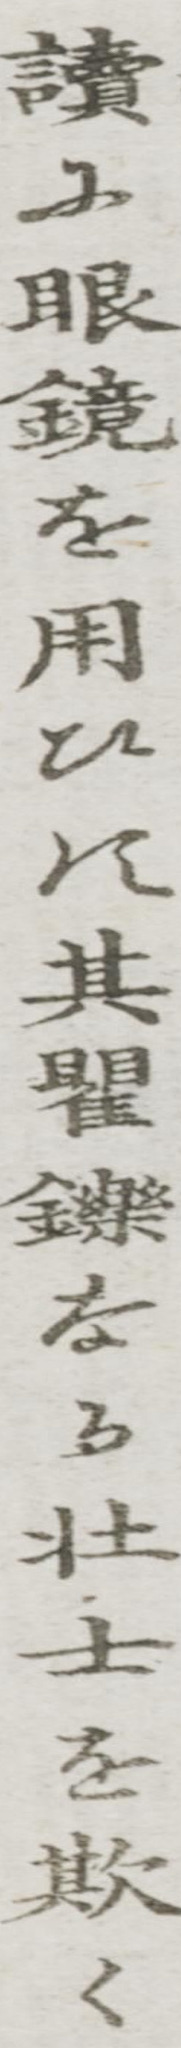讀に眼鏡を用ひす其矍鑠なる壮士を欺く
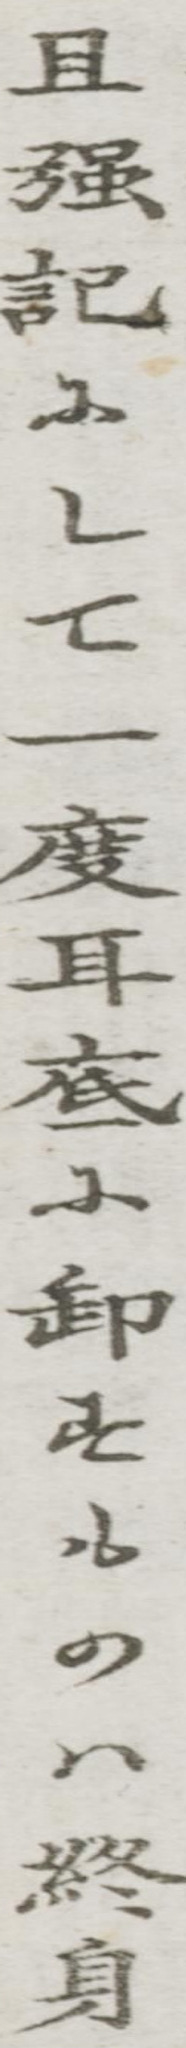且強記にして一度耳底に卸すものは終身

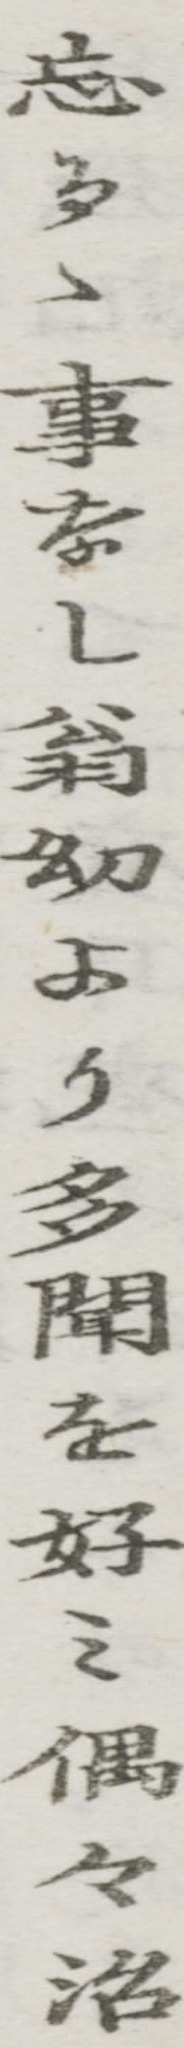忘るゝ事なし翁幼より多聞を好み偶々治
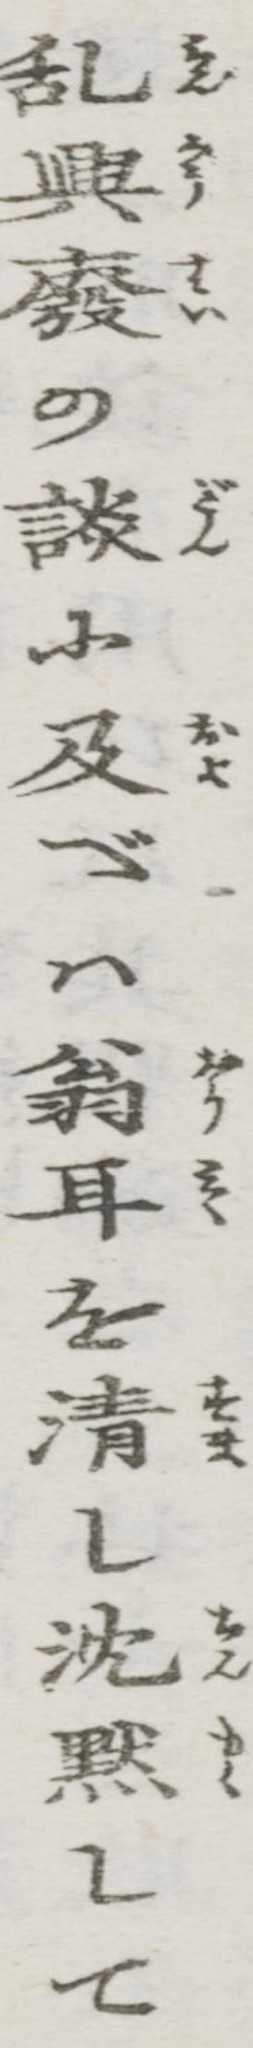乱興廢の談に及べは翁耳を清し沈黙して
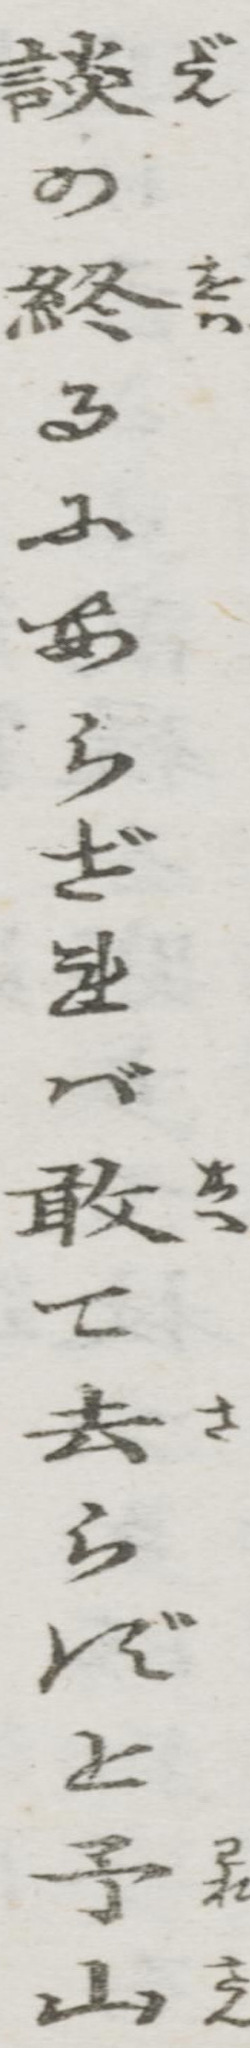談の終るにあらざれば敢て去らずと予山
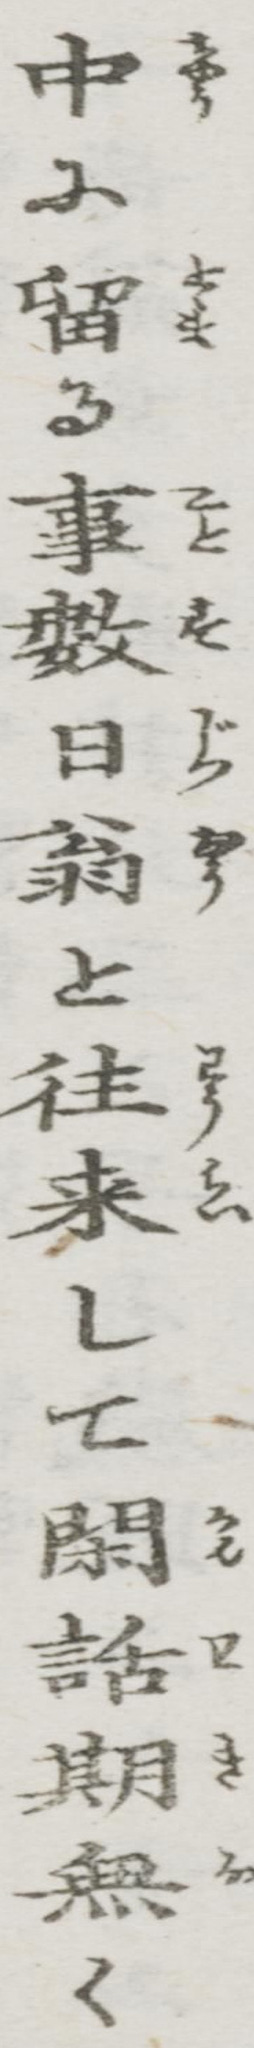中に留る事数日翁と往来して閑話期無く
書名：塩原繁昌記　全
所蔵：東京大学地震研究所図書室 Earthquake Research Institute Library, The University of Tokyo, JAPAN
